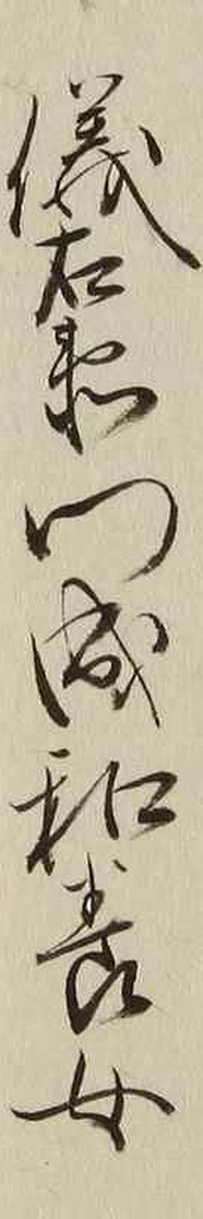女儀右衛門成和養女
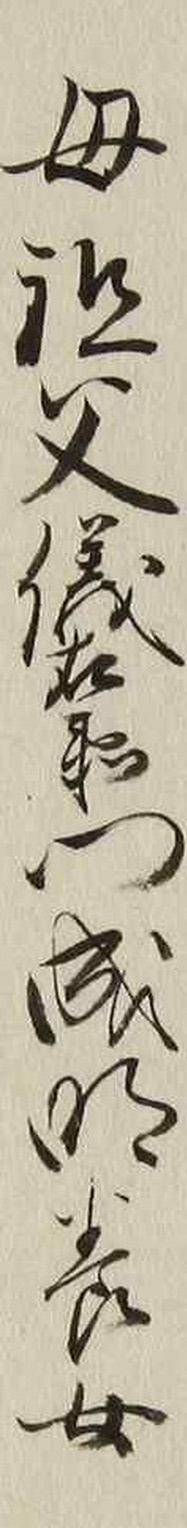母祖父儀右衛門成明養女

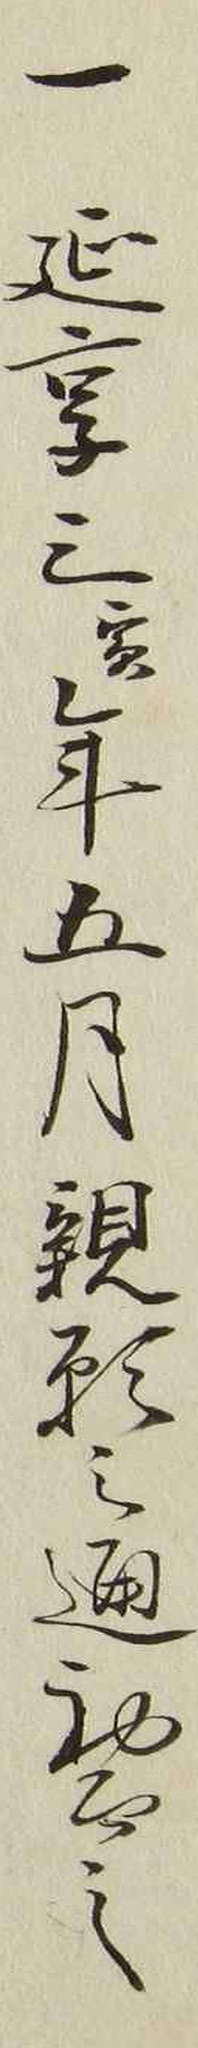一延享三寅年五月親願之通初而之
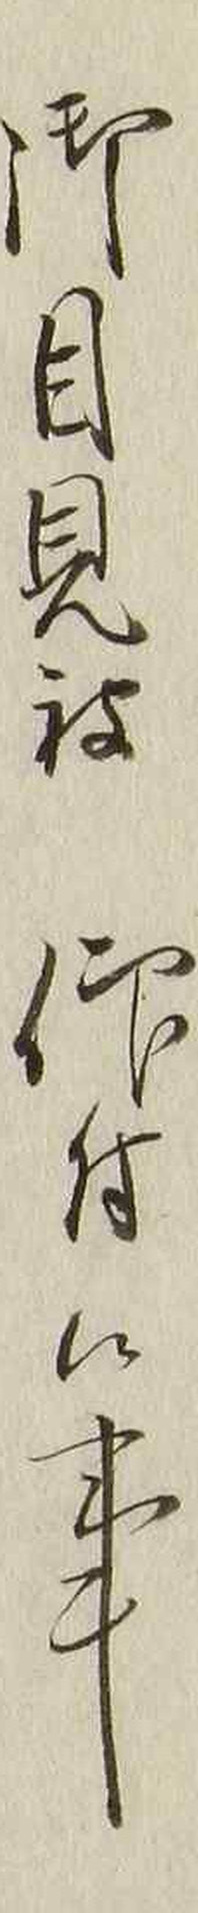御目見被仰付候事
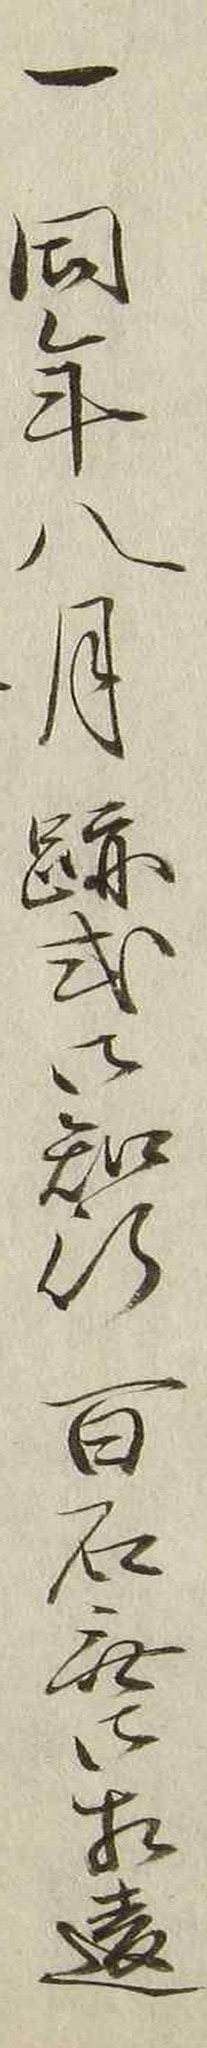一同年八月跡式御知行百石無御相違
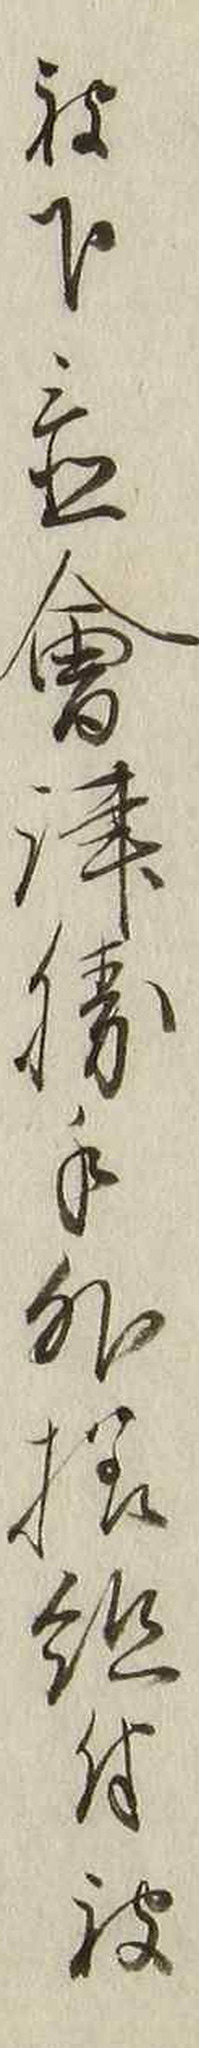被下置会津勝手外様組付被
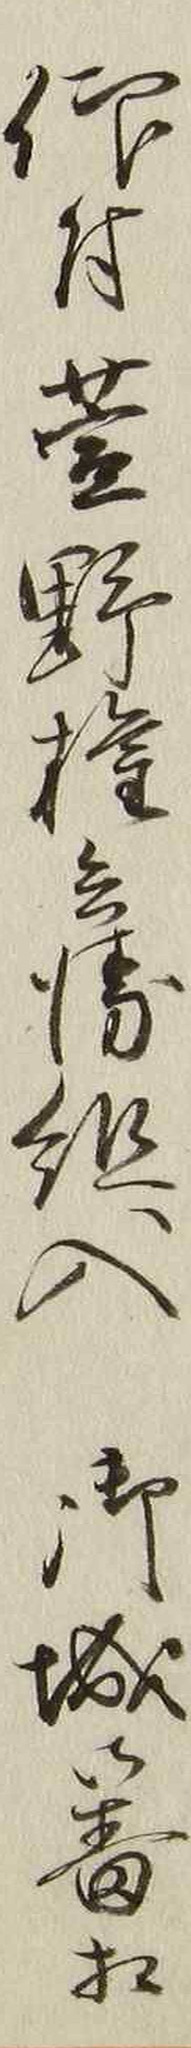仰付萱野権兵衛組ㇸ入御城御番相
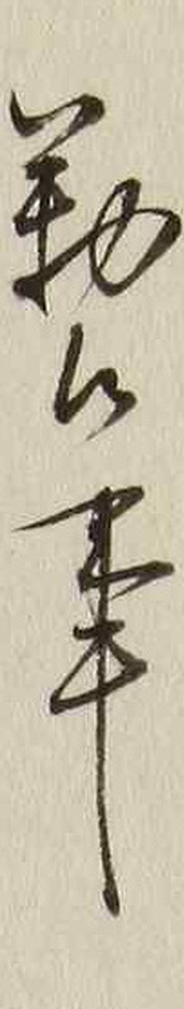勤候事
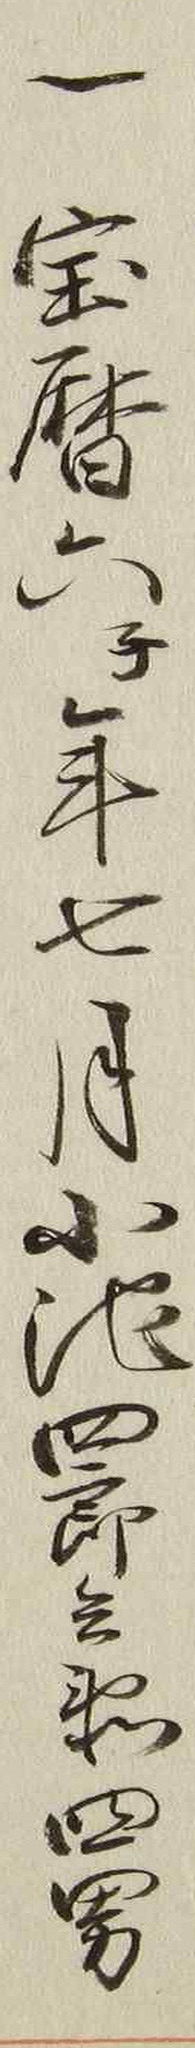一宝暦六子年七月小池四郎兵衛四男
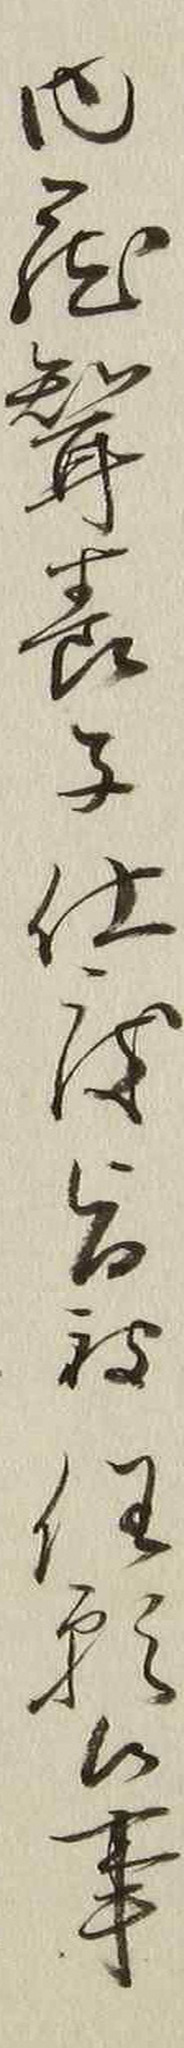内蔵聟養子仕度旨被任願候事
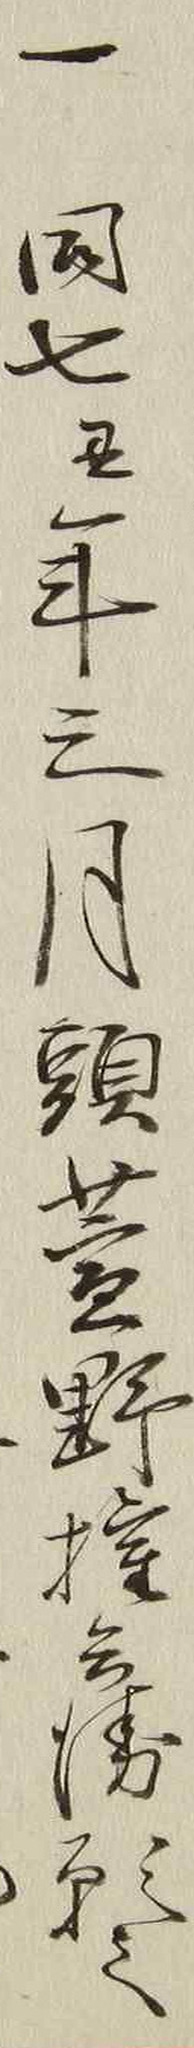一同七丑年三月頭萱野権兵衛願之
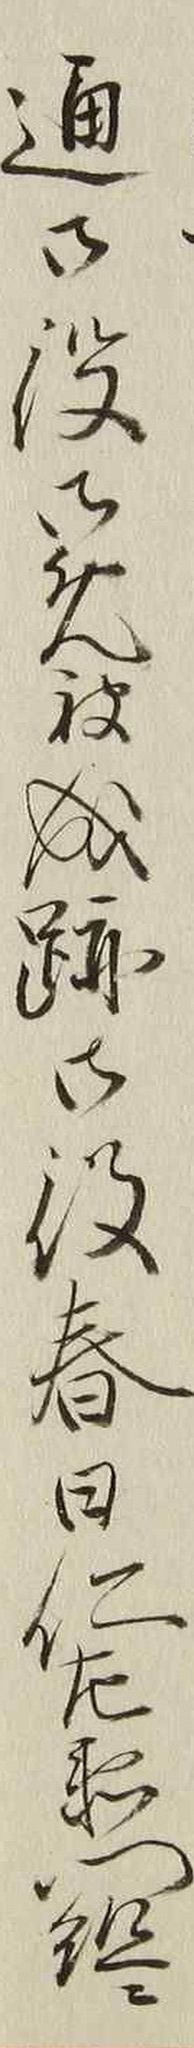通御役御免被成跡御役春日仁左衛門組ニ
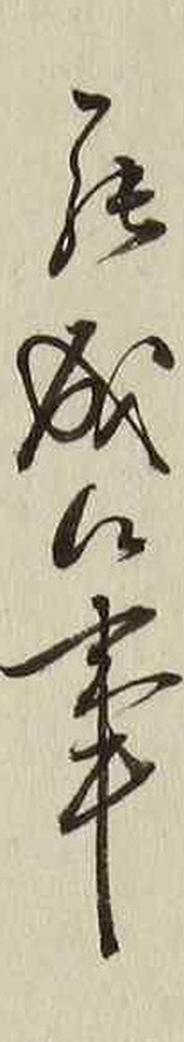罷成候事
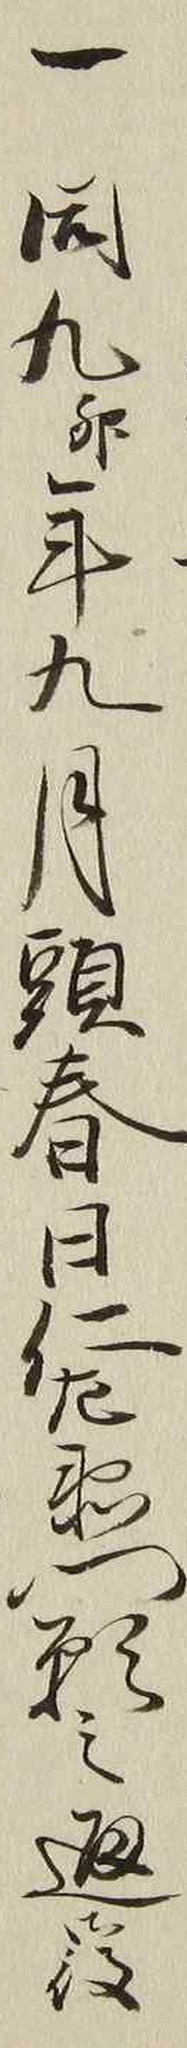一同九卯年九月頭春日仁左衛門願之通御役
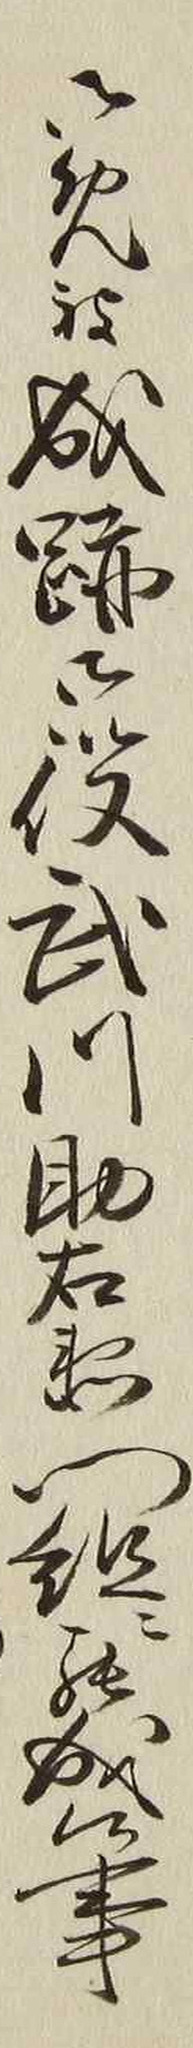御免被成跡御役武川助右衛門組ニ罷成候事
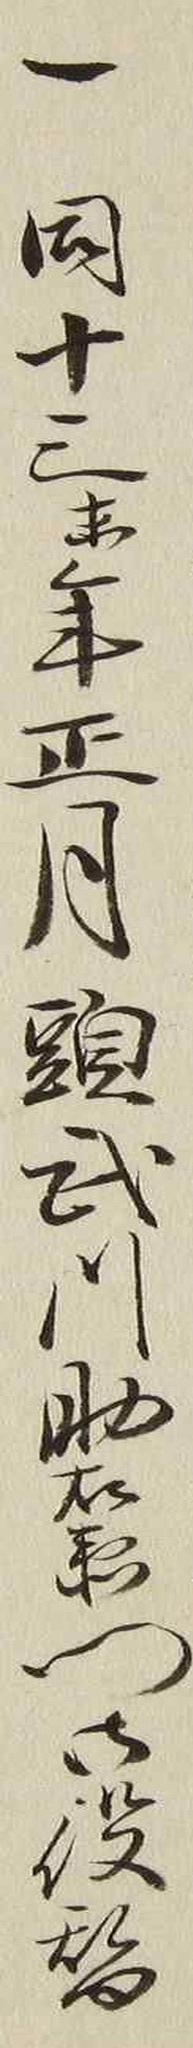一同十三未年正月頭武川助右衛門御役替
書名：諸士系譜　巻之163　な之部5
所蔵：会津若松市立会津図書館
